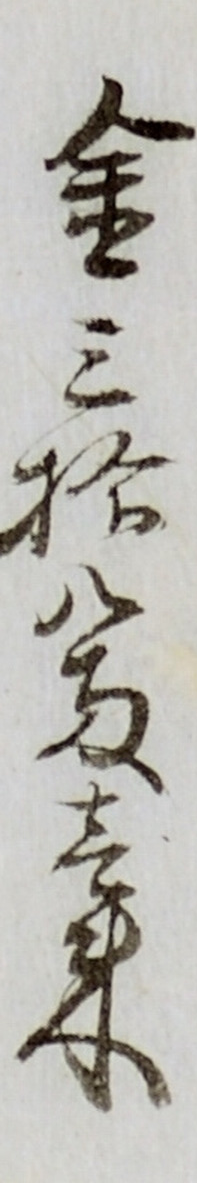金三拾八両壱朱
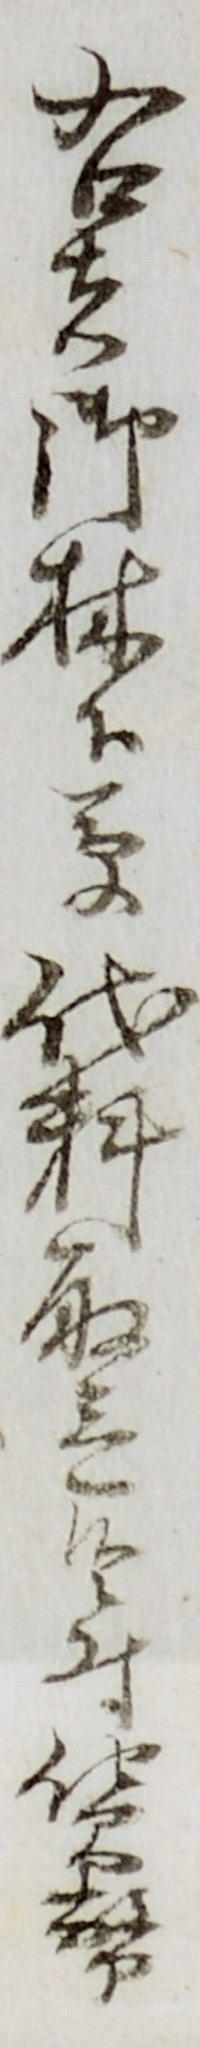右は御林下草代料取立候に付貨幣
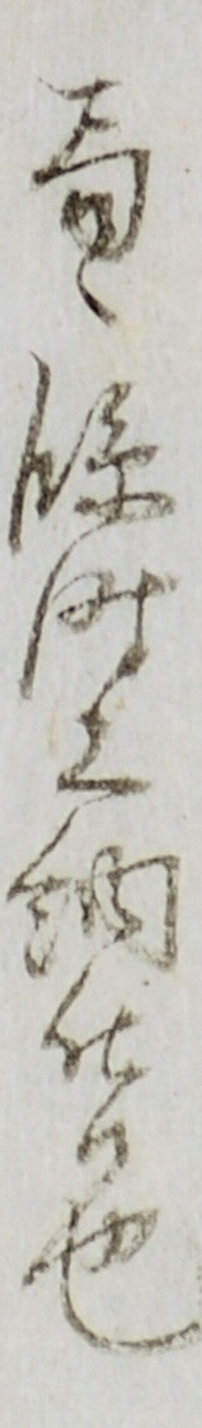局へ臨時上納仕候也
